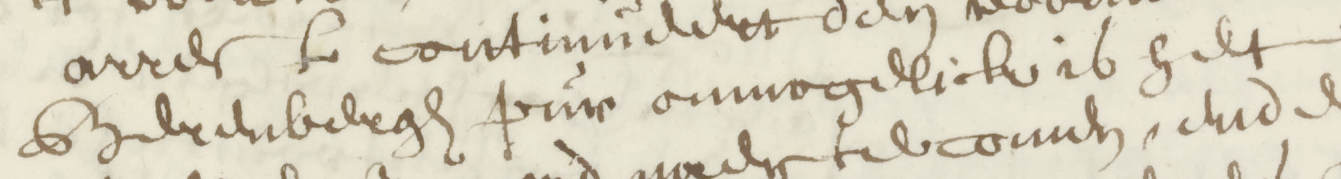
Berenbergh pur onmogelick is het
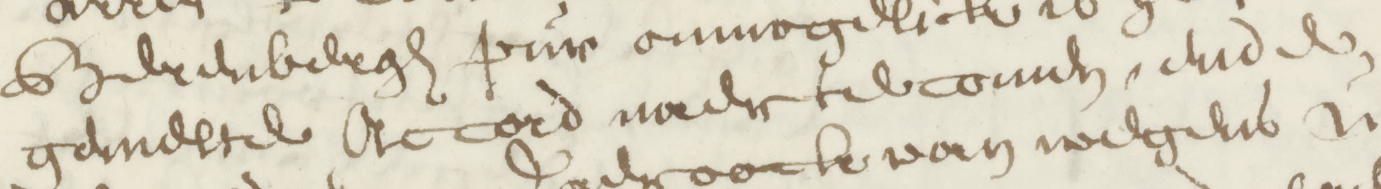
gemelte Accord naer te comen, ende
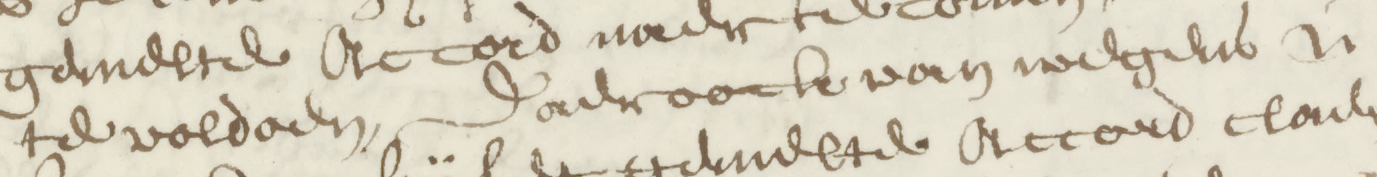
te voldoen, Daer oock van wegens U
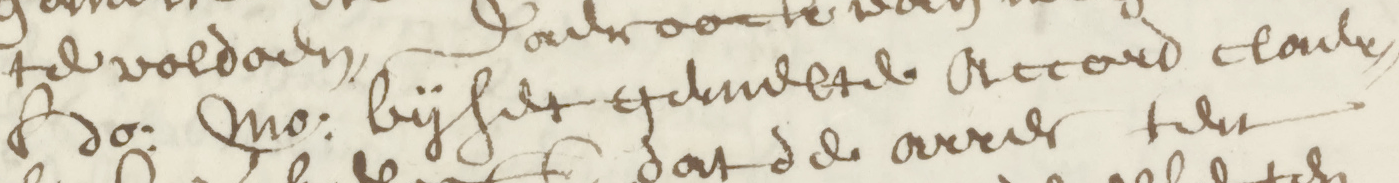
Ho:Mo: bij het gemelte Accord claer„
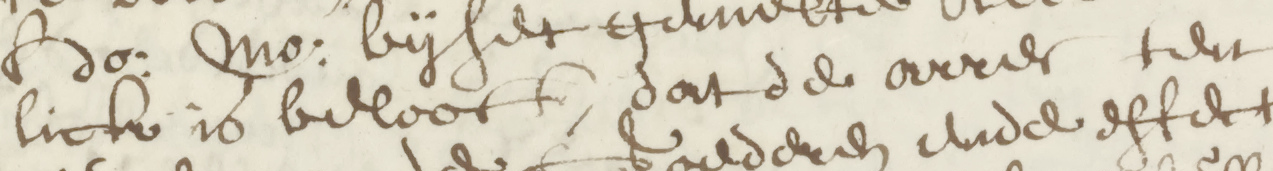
lick is belooft, dat de arresten
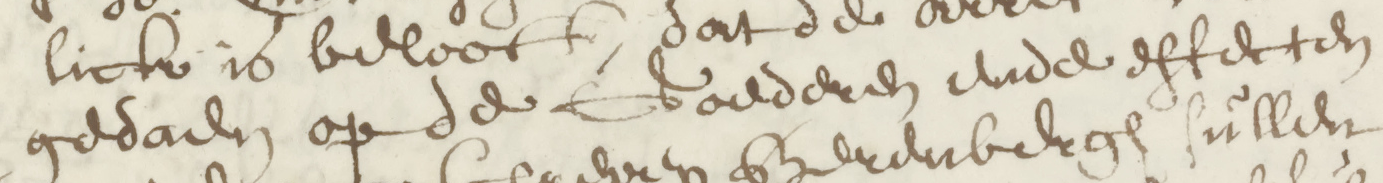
gedaen op de Goederen ende effecten
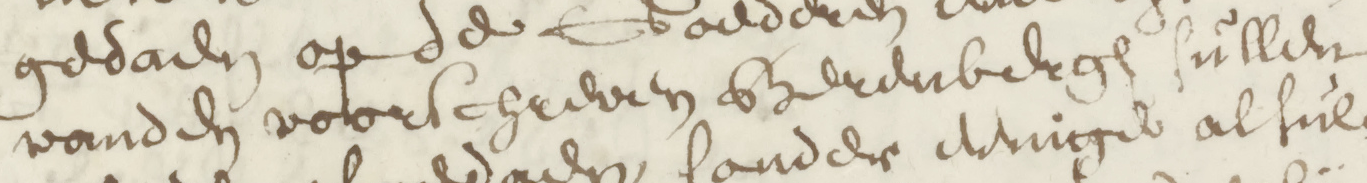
vanden voorschreven Berenbergh sullen
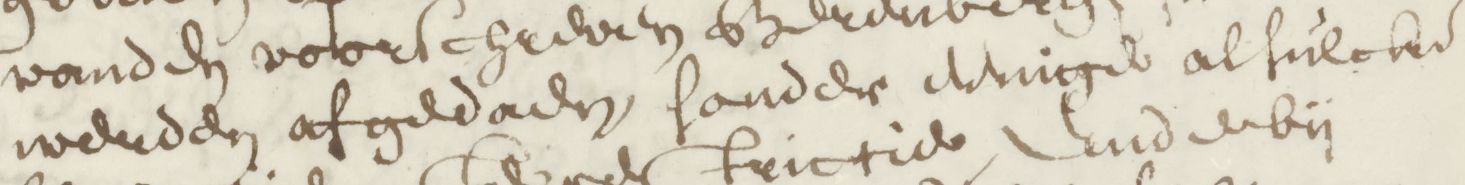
werden afgedaen, sonder eenige alsulcke
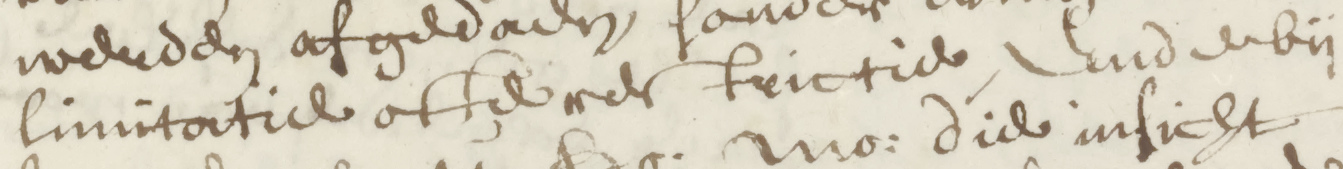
limitatie ofte restrictie, Ende bij
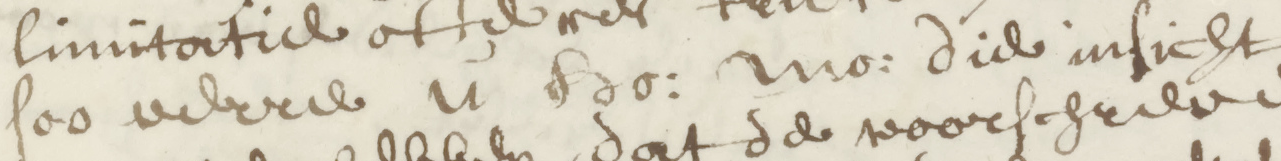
soo verre U Ho:Mo: die insicht
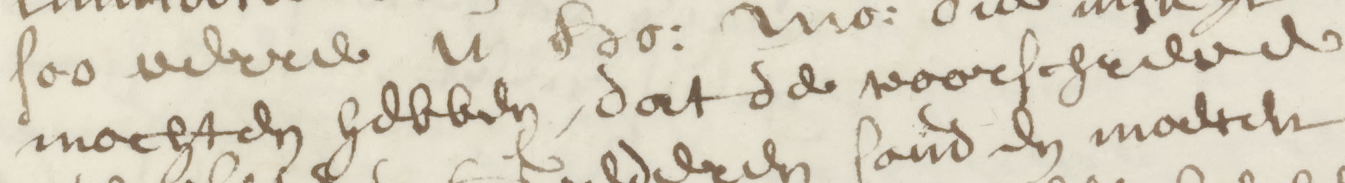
mochten hebben, dat de voorschreve
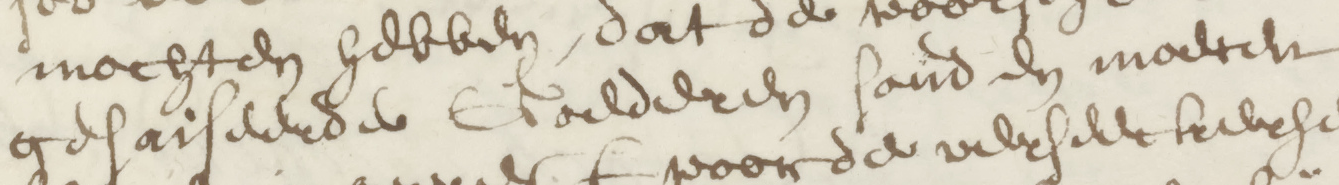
gesaiseerde Goederen souden moeten
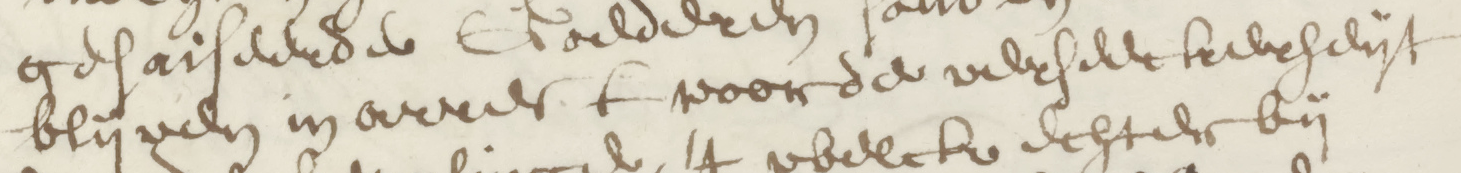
blijven in arrest voorde verseeckerheijt
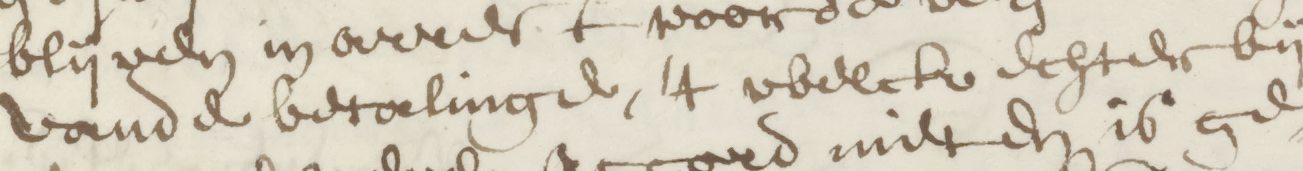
vande betalinge, 't welck echter bij
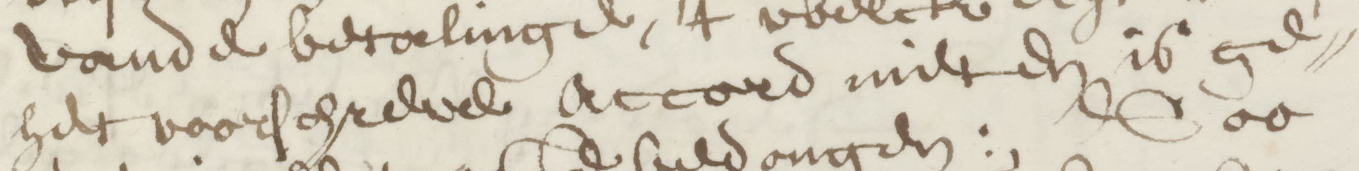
het voorschreve Accord niet en is ge„
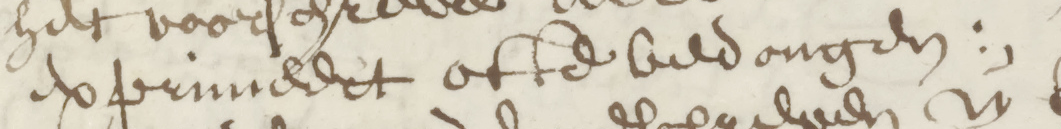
exprimeert ofte bedongen: Soo
